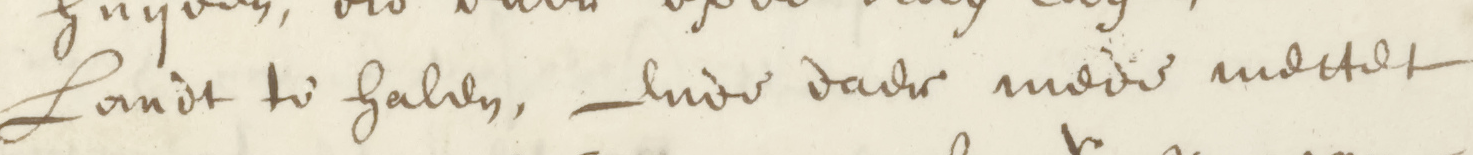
Landt te halen, ende daer mede mettet
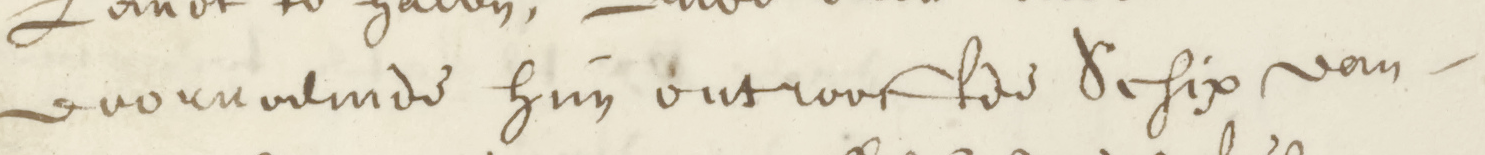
voornoemde hun ontrooffde Schip van —
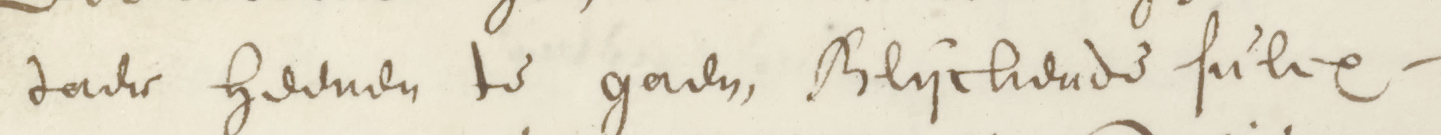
daer heenen te gaen. Blijckende sulcx
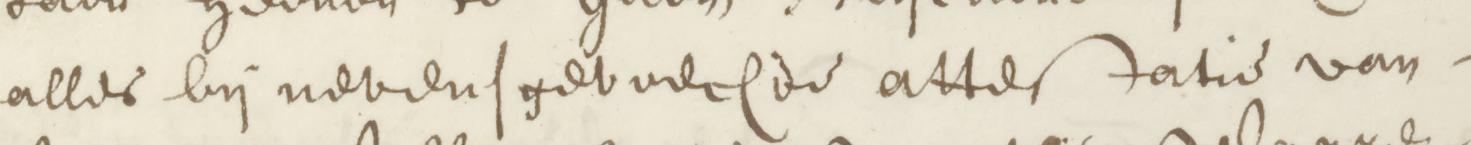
alles bij nevensgevoechde attestatie van
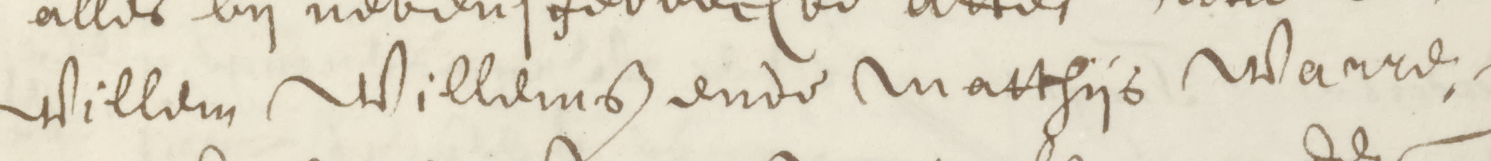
Willem Willems ende Matthijs Warre„
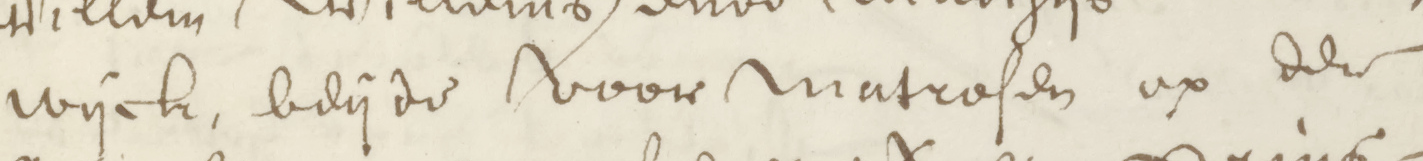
wijck, beijde voor matrosen op der
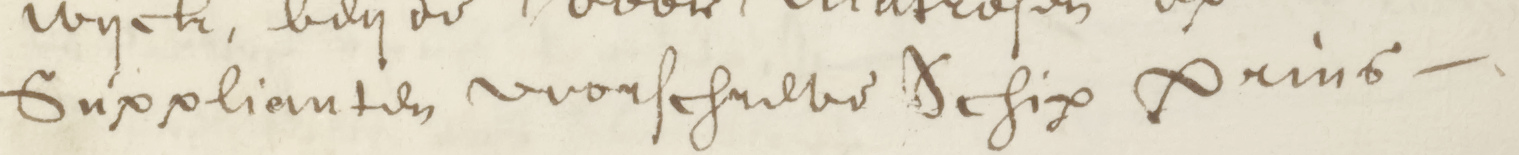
Supplianten voorschreve Schip Prins —
